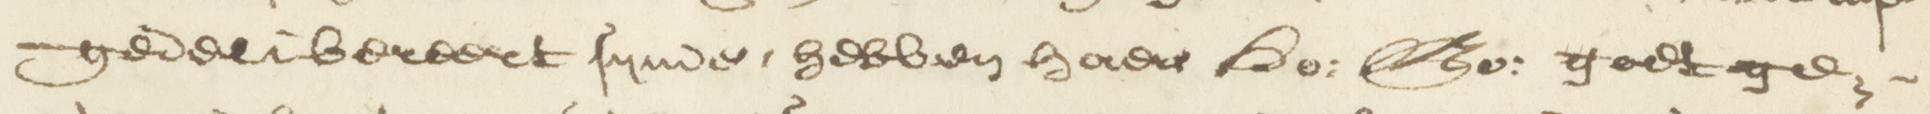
gedelibereert synde, hebben haer Ho:Mo: goetge,,
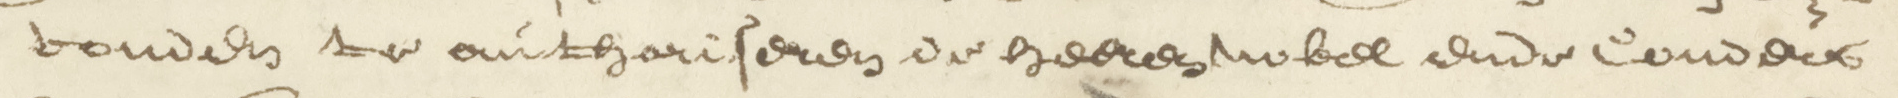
vonden te authoriseren de heeren nobel ende Conders
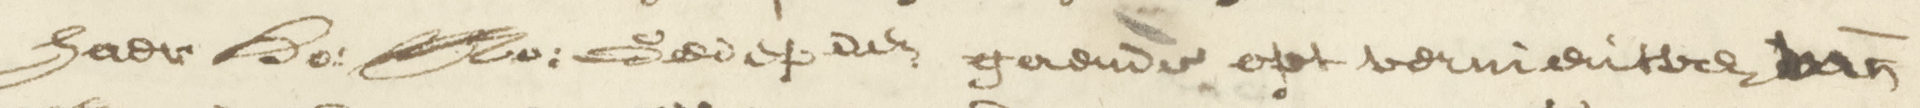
haer Ho:Mo: Gedepden. gaende opt vernieuwen van
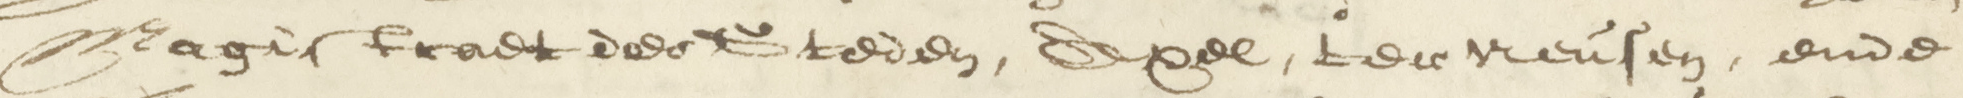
Magistraet der Steden, Axel, ter Neusen, ende
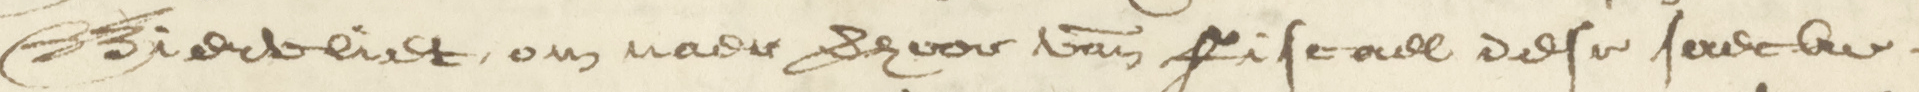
Biervliet, om naer vhoor van Fiscael dese saecke
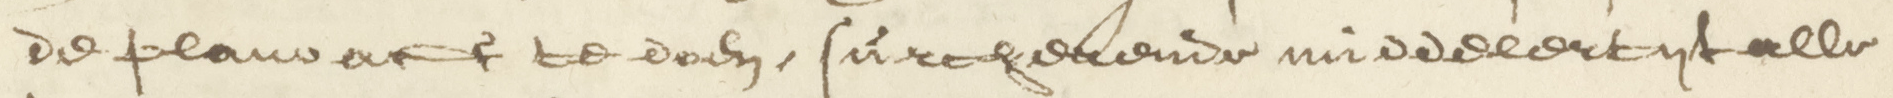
de plano aff te doen, surcherende middelertyt alle
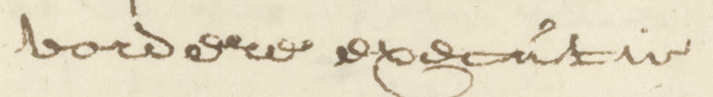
vordere executie
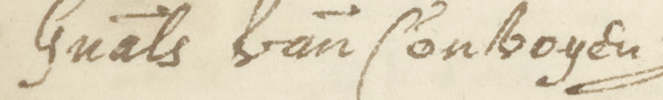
Gnals van Convoyen
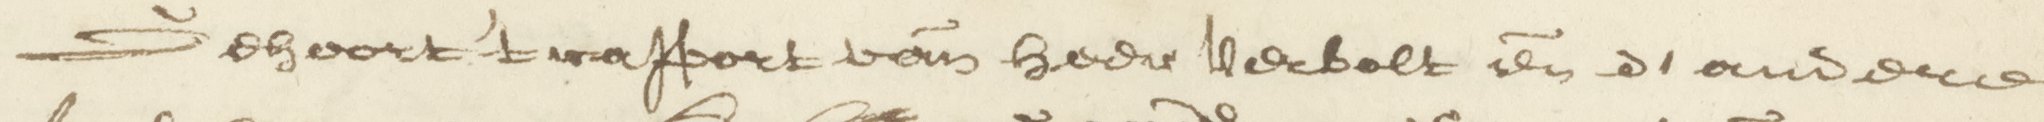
Gehoort 'trapport van heer Verbolt en d'andere
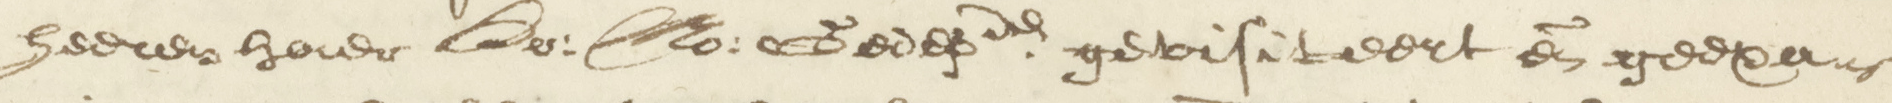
heeren haer Ho:Mo: Gedepden. gevisiteert en geexa„
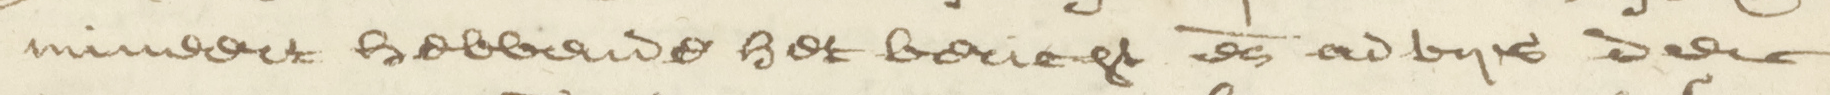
mineert hebbende het bericht en advys der
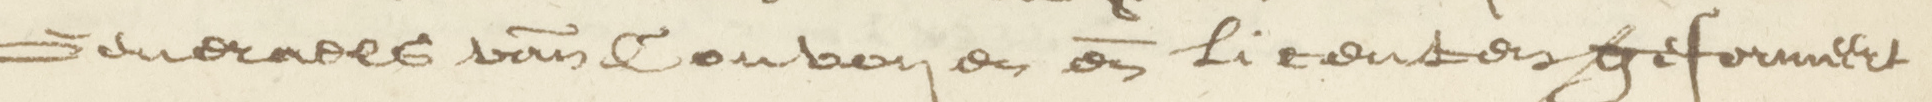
Generaels van Convoyen en Licenten geformeert
